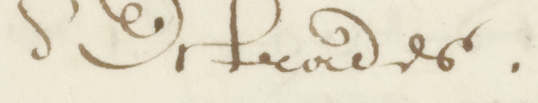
D'Estrades
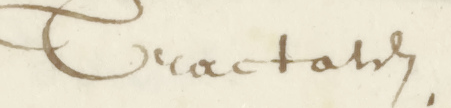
Tractaten
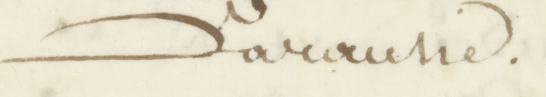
Garantie
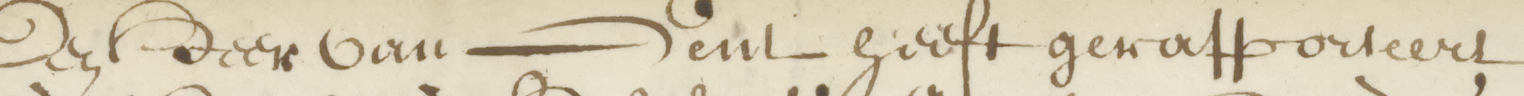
Den heer van Gent heeft gerapporteert
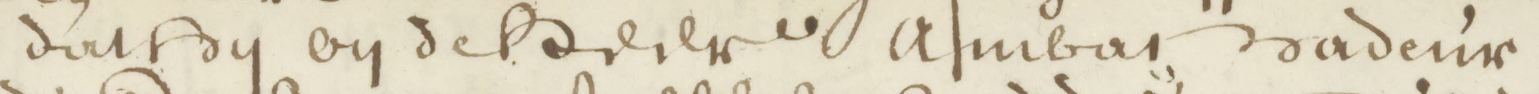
dat hij bij de heer Ambassadeur
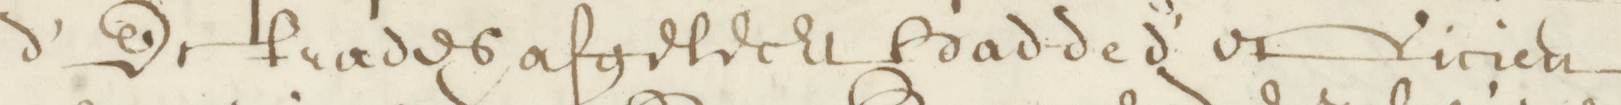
d'Estrades afgelecht hadde d'officien
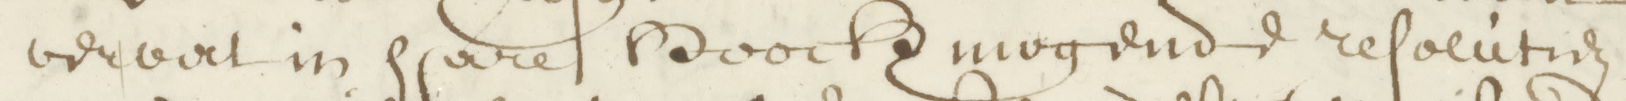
vervat in hare Hooch Mogende resolutien
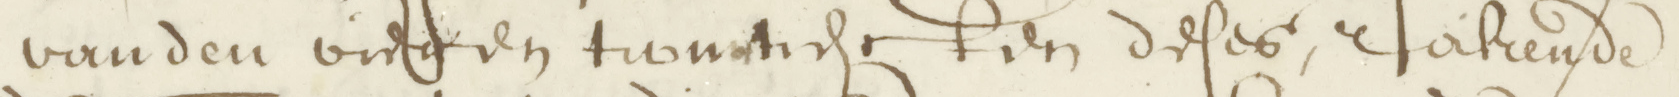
van den vier en twintichsten deses, rakende
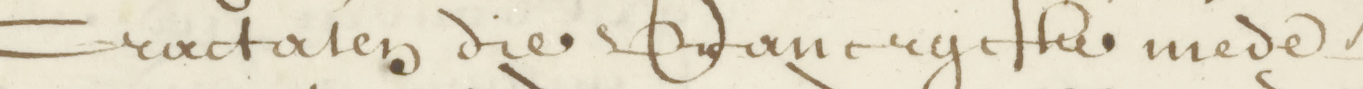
de Tractaten die Vrancrijck mede
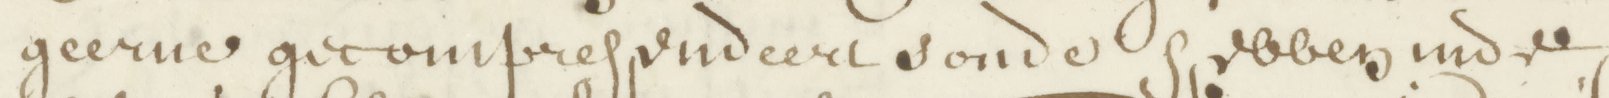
geerne gecomprehendeert soude hebben inde
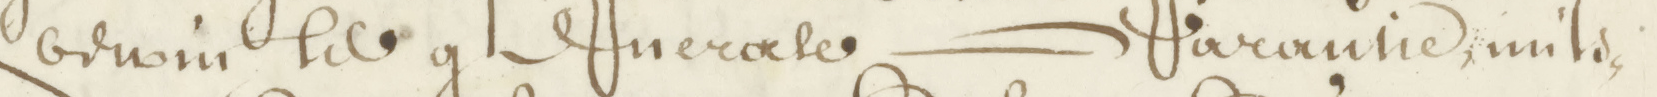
bewuste generale Garantie, mits„
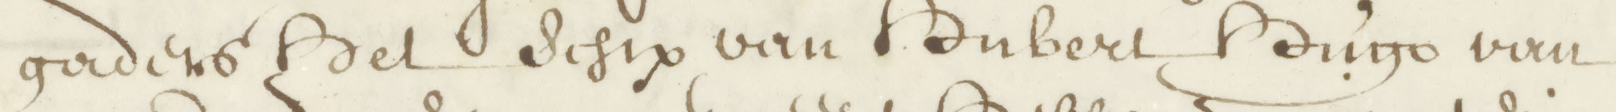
gaders het schip van Hubert Hugo van
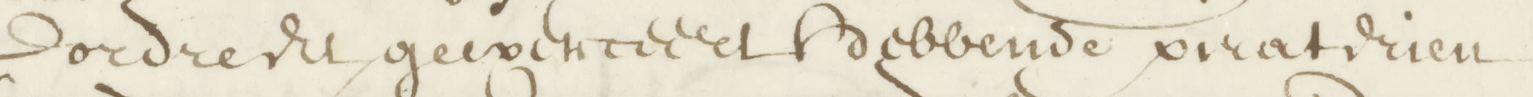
Dordrecht geexerceert hebbende piraterien
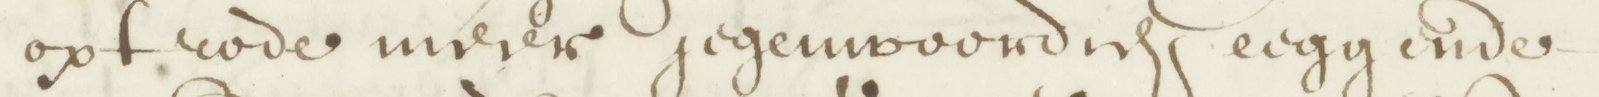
opt Rode meer jegenwoordich leggende
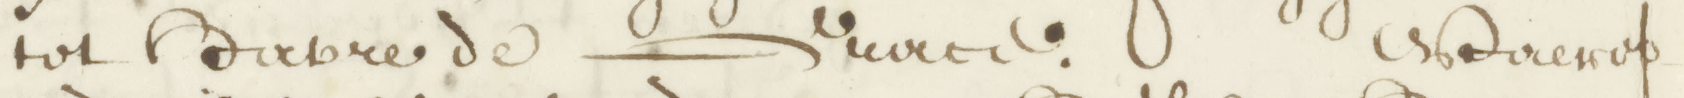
tot Havre de Grace. Waerop
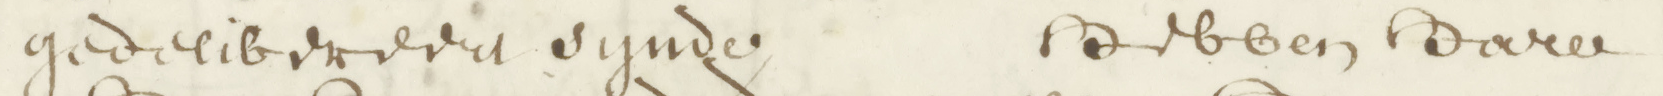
gedelibereert sijnde, hebben hare
